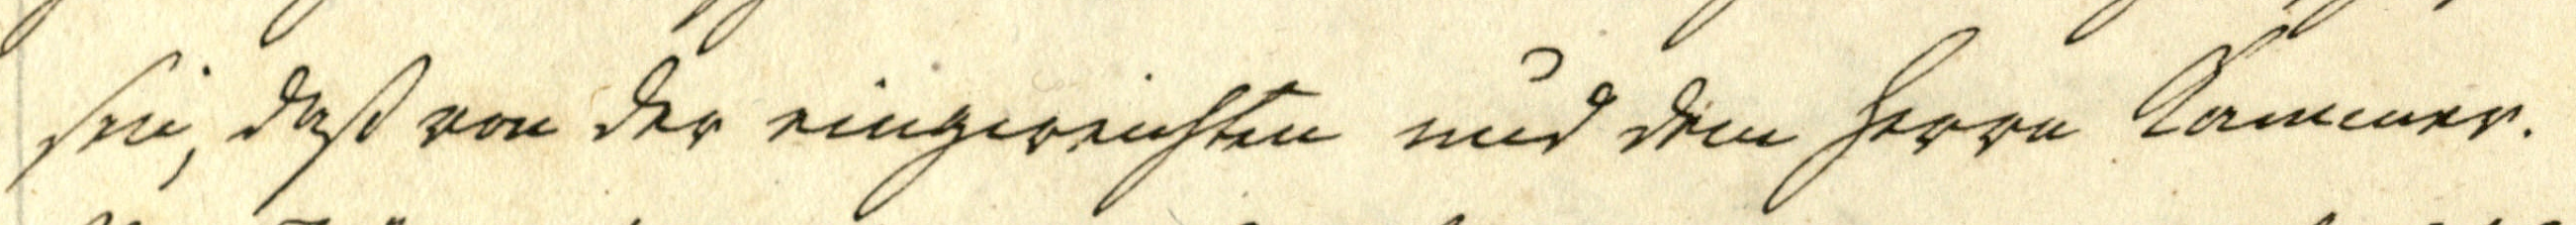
sen, daß von der eingereichten und dem herrn Kammer¬
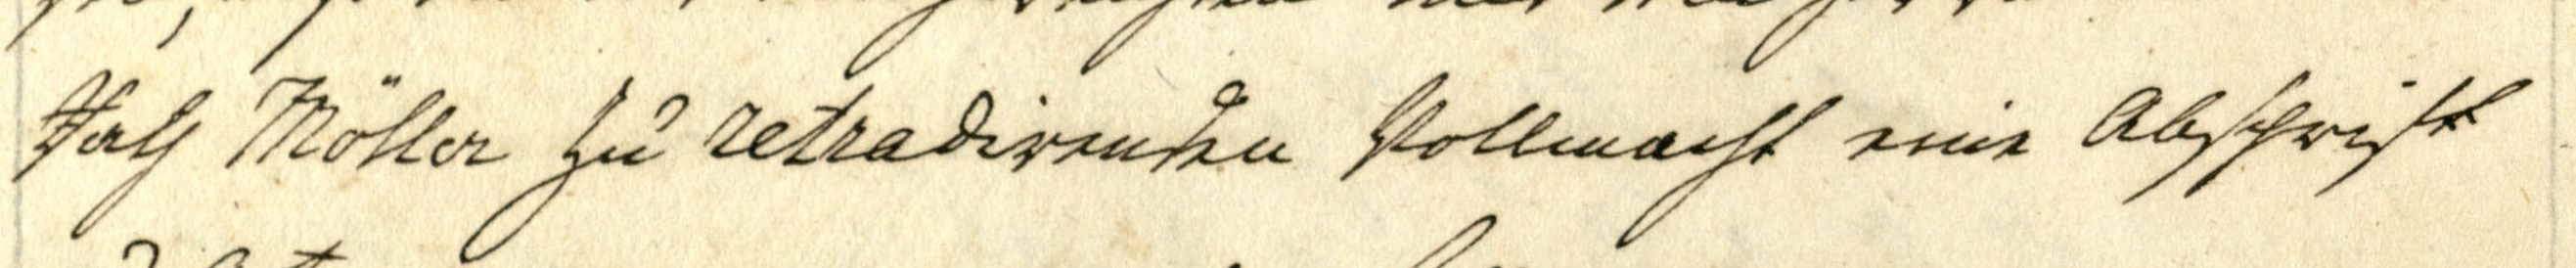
Rath Möller zu retradirenden Vollmacht eine Abschrift
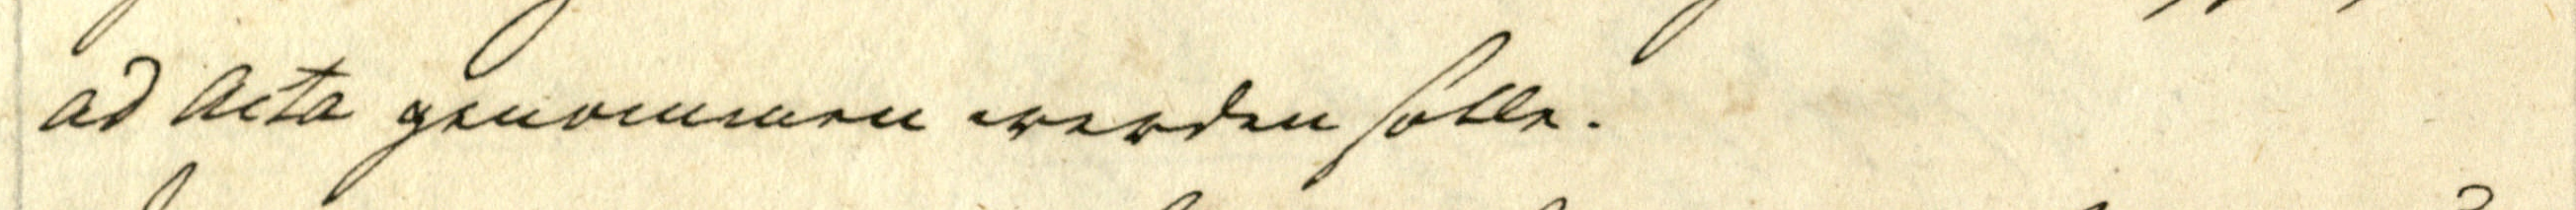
ad Acta genommen werden solle.
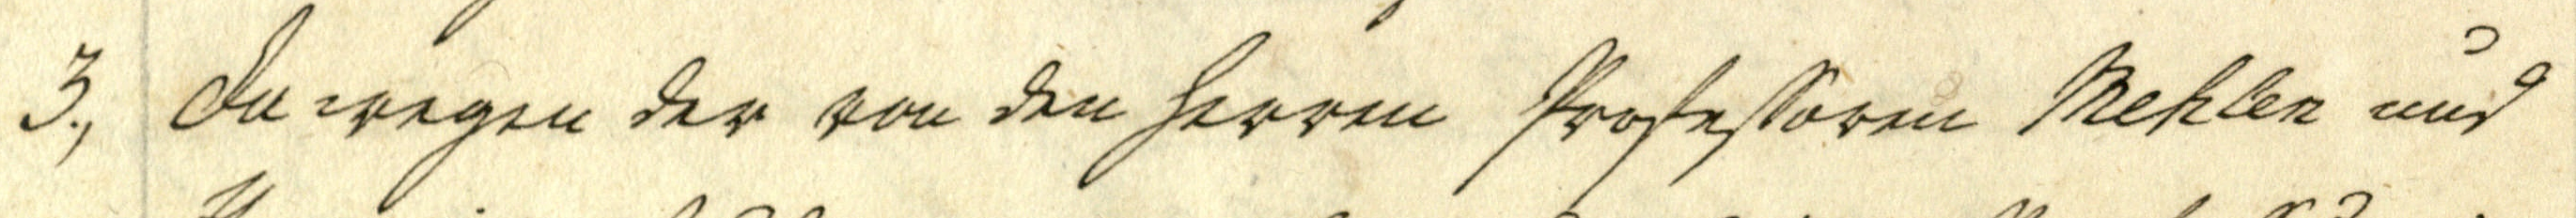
3., Da wegen der von den herren Professoren Mehlen und
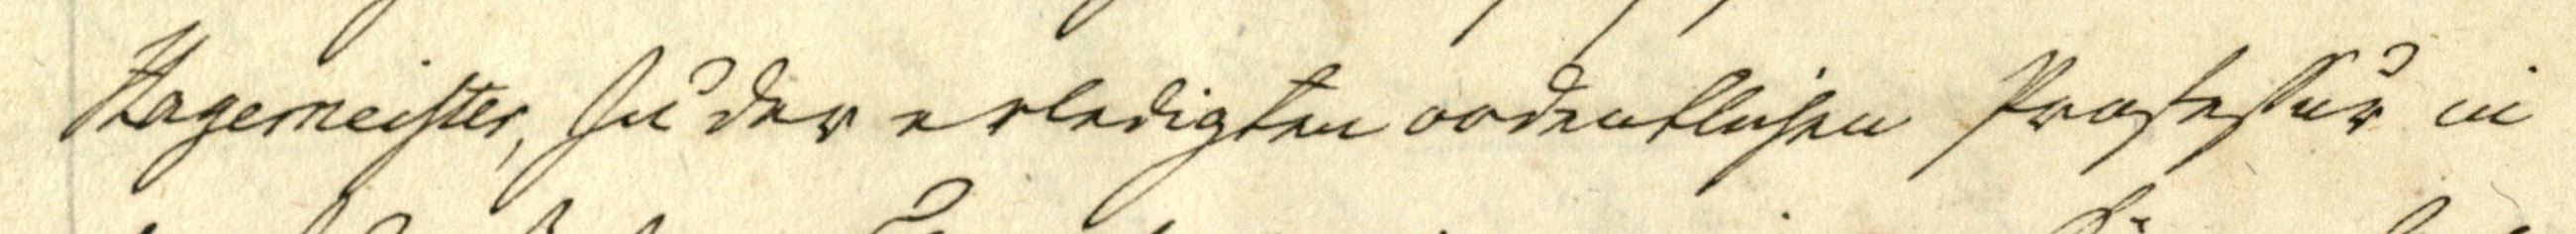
Hagemeister, zu der erledigten ordentlichen Professur in
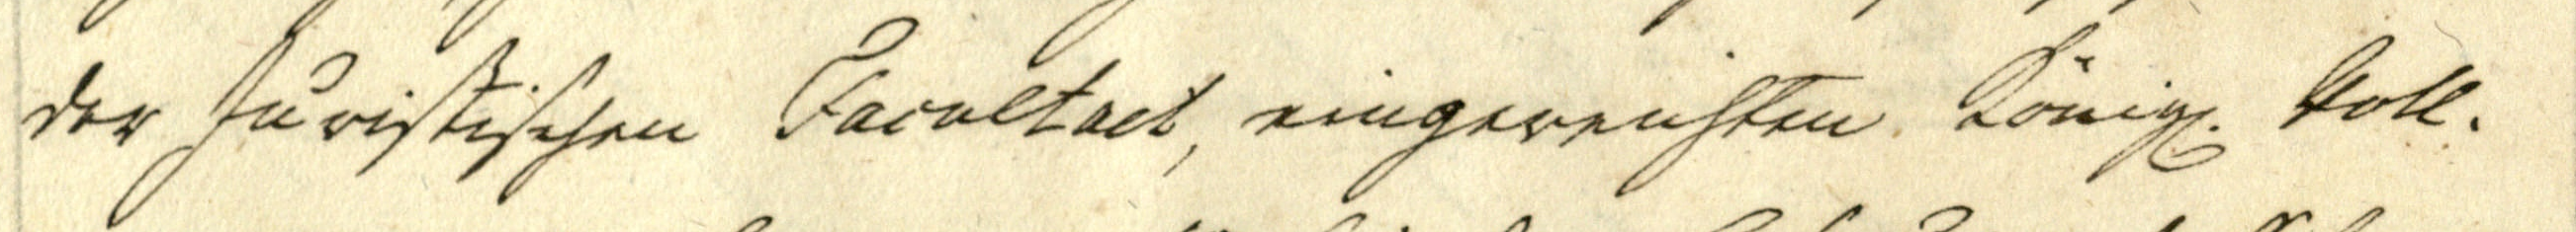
der Juristischen Facultaet, eingereichten Königl. Voll¬
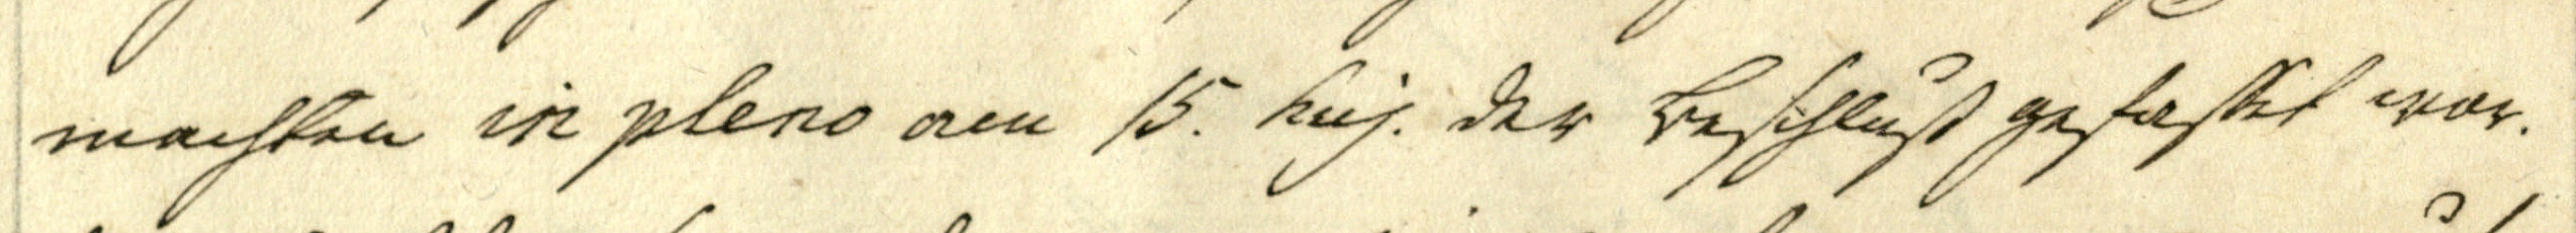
machten in pleno am 15. huj. der Beschluß gefasset wor¬
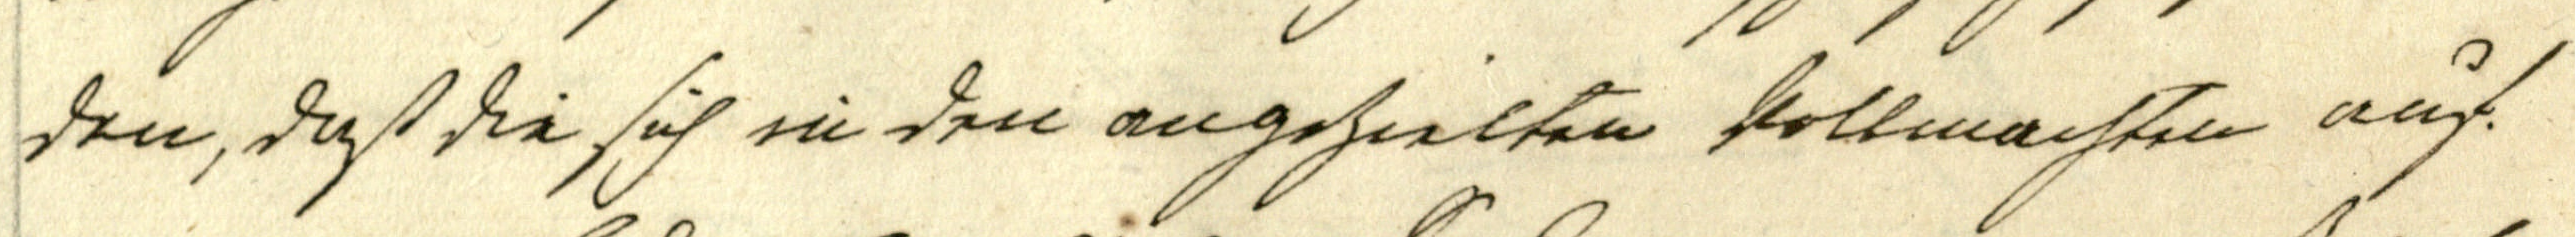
den, daß die sich in den angezielten Vollmachten auf¬
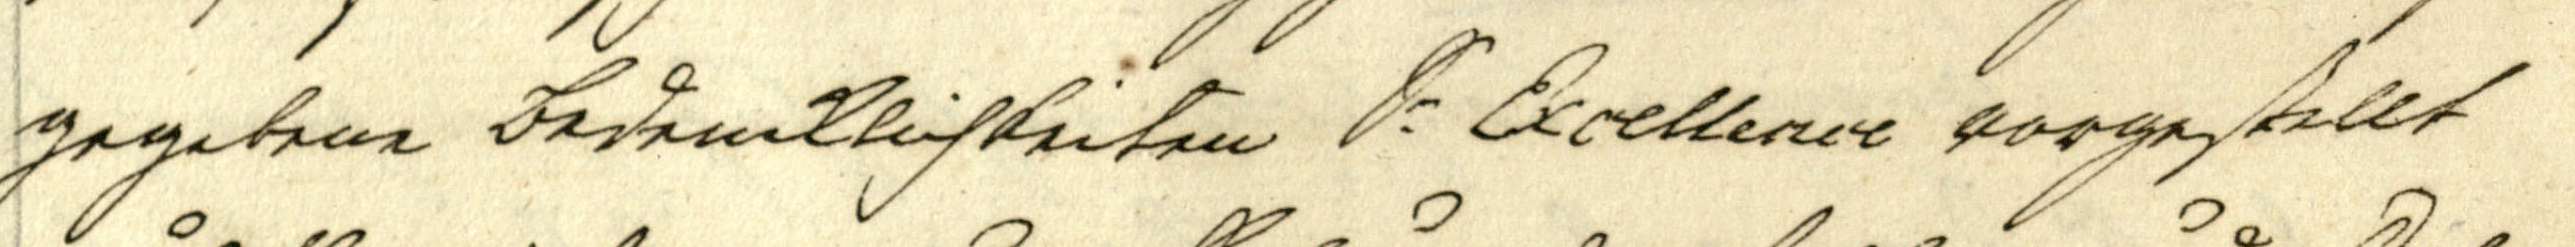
gegebene Bedencklichkeiten Sr. Excellence vorgestellt
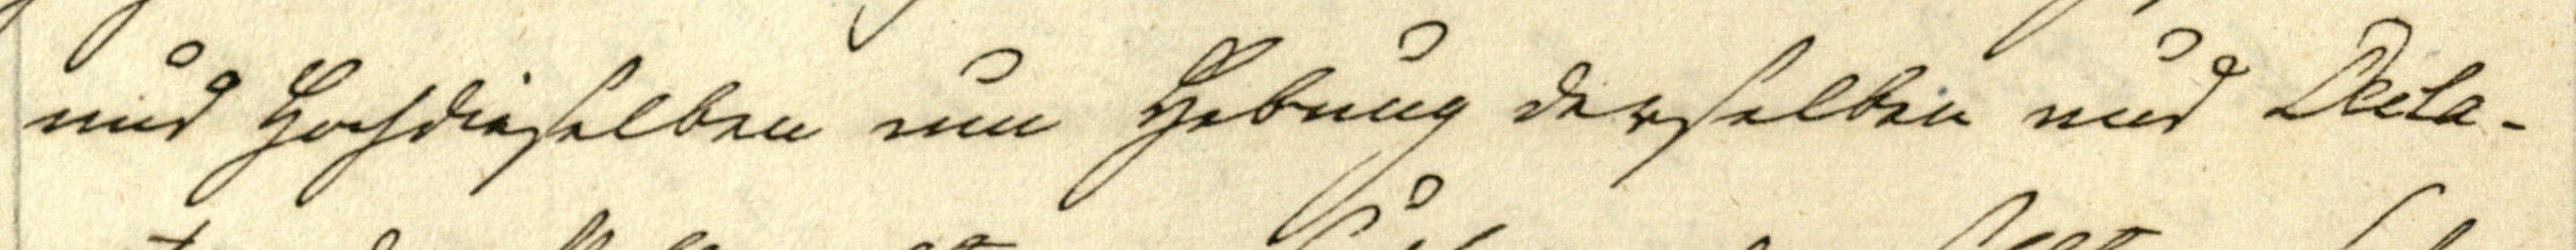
und Hochdieselben um Hebung derselben und Decla¬
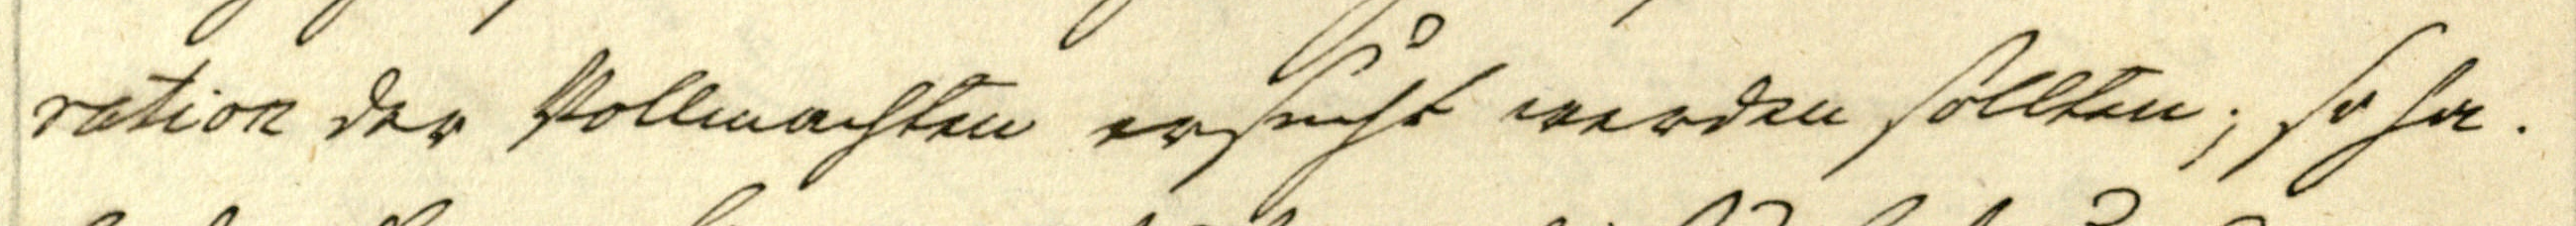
ration der Vollmachten ersucht werden sollten; so ha¬
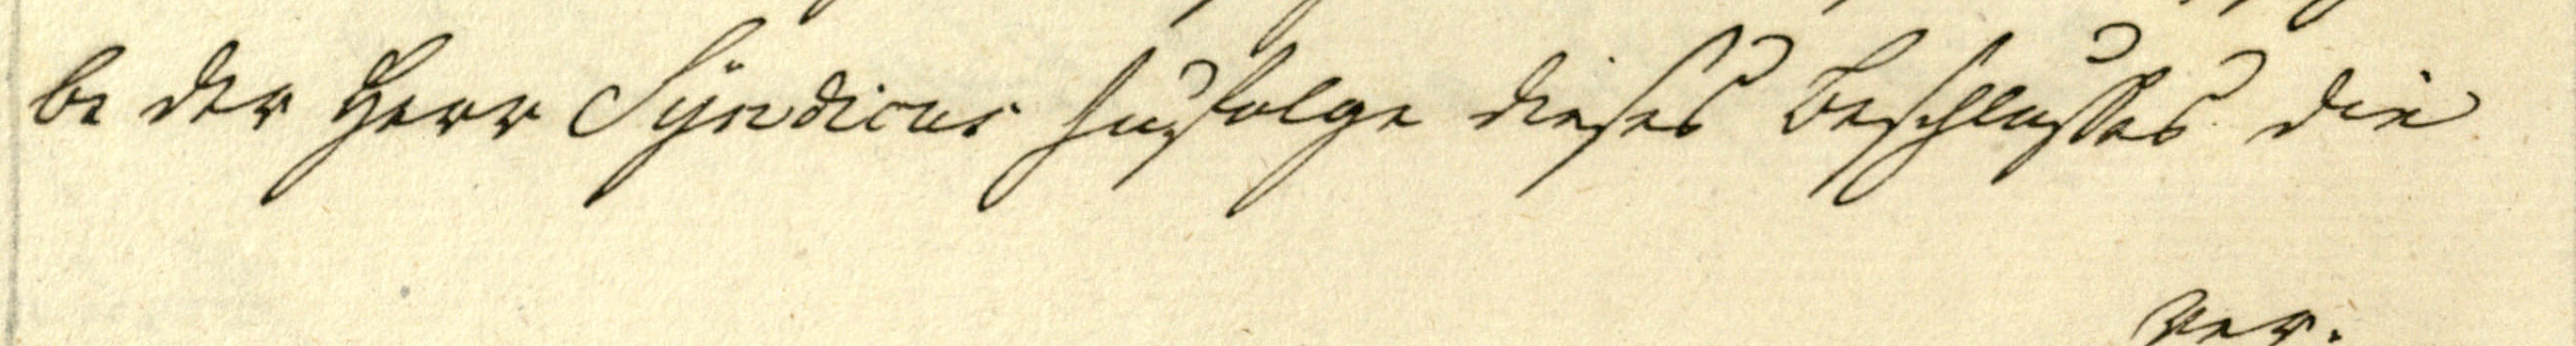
be der Herr Sÿndicus zufolge dieses Beschlusses die
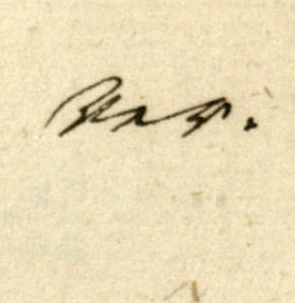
ver
